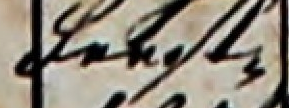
Seest„
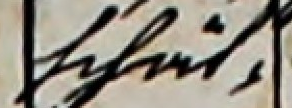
eschät„
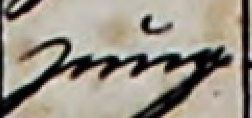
zung
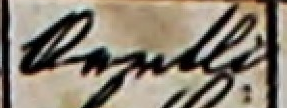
Oertli„
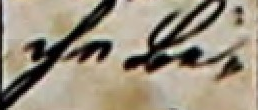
che Be
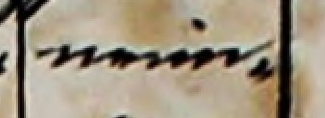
n???„
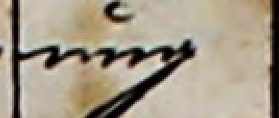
ung
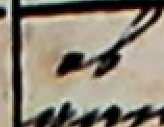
ob
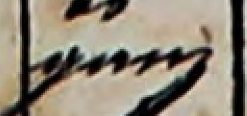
ganz
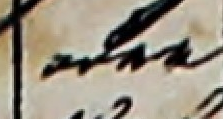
wer
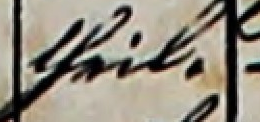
theil.
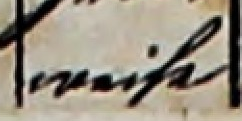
weise
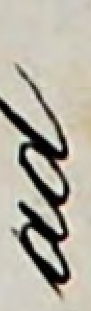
ad
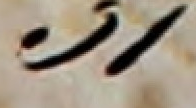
51
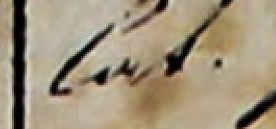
Cat.
